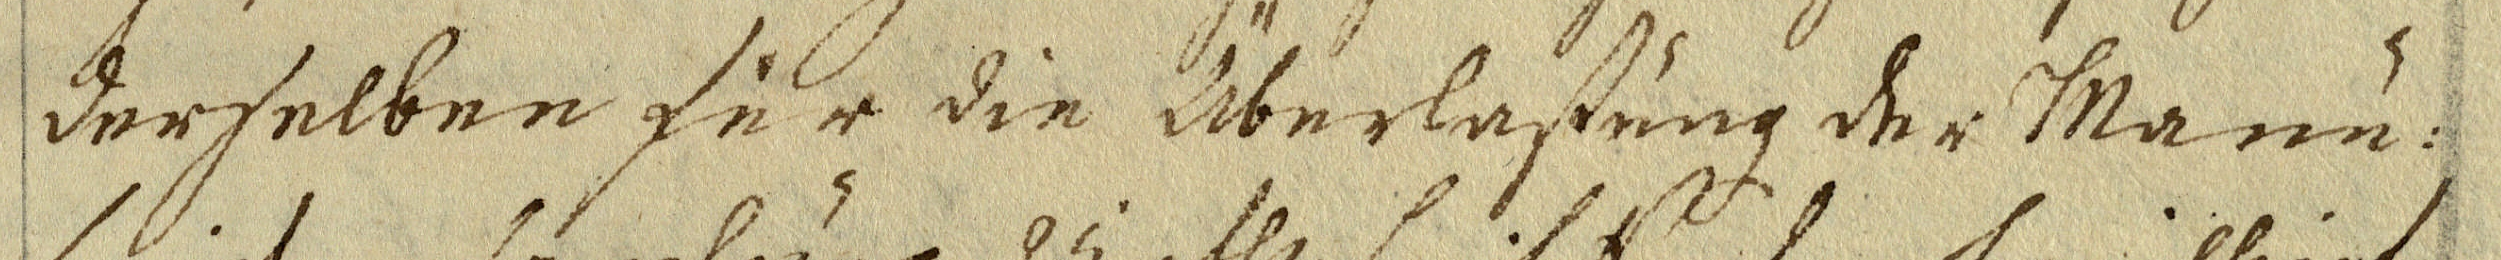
derselben für die Überlassung der Manu¬
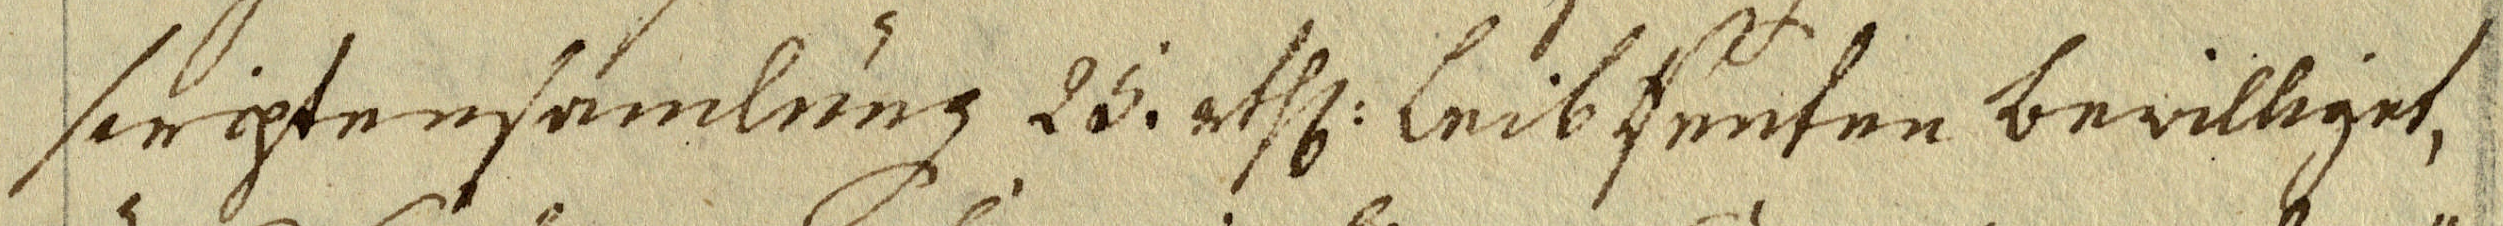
scriptensamlung 25 rthl. LeibRenten bewilliget,
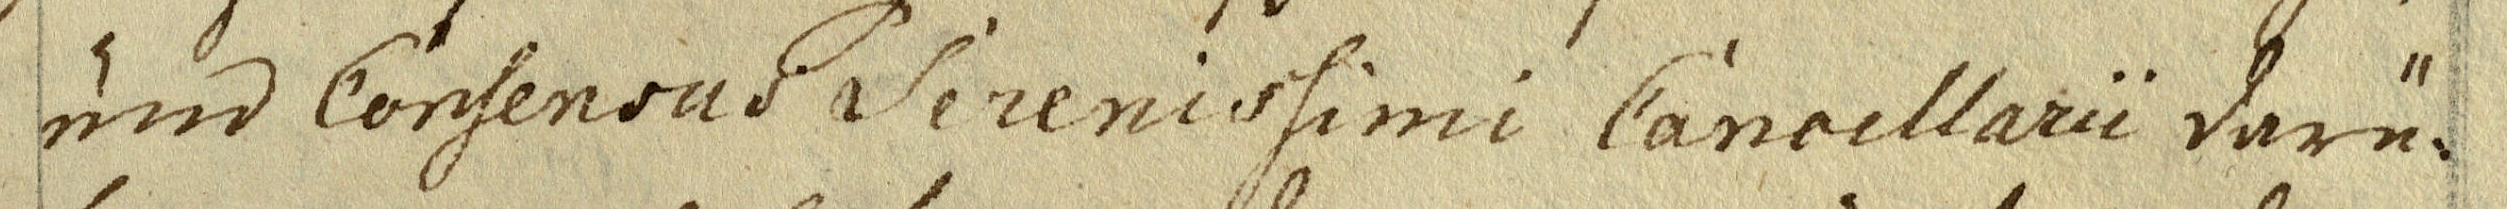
und Consensus Seremissimi Cancellarii darü¬
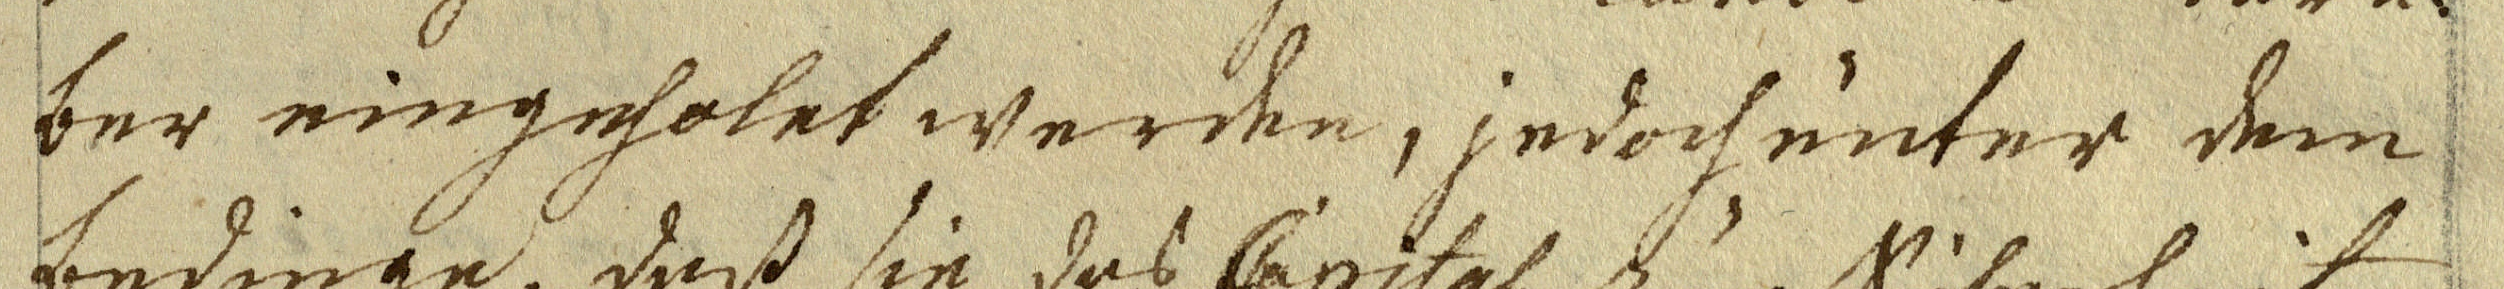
ber eingeholet werden, jedoch unter dem
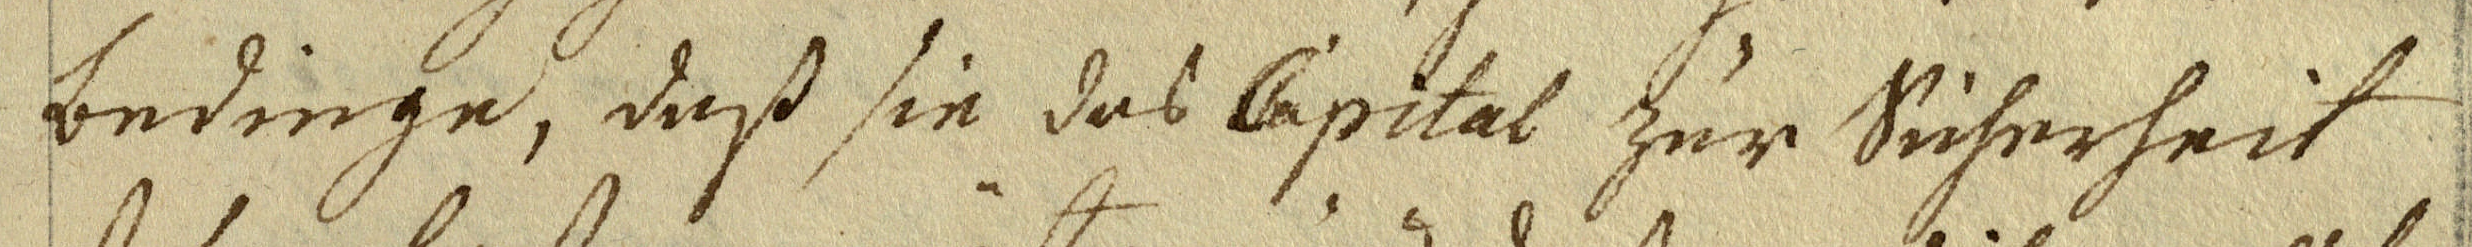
Bedinge, daß sie das Capital zur Sicherheit
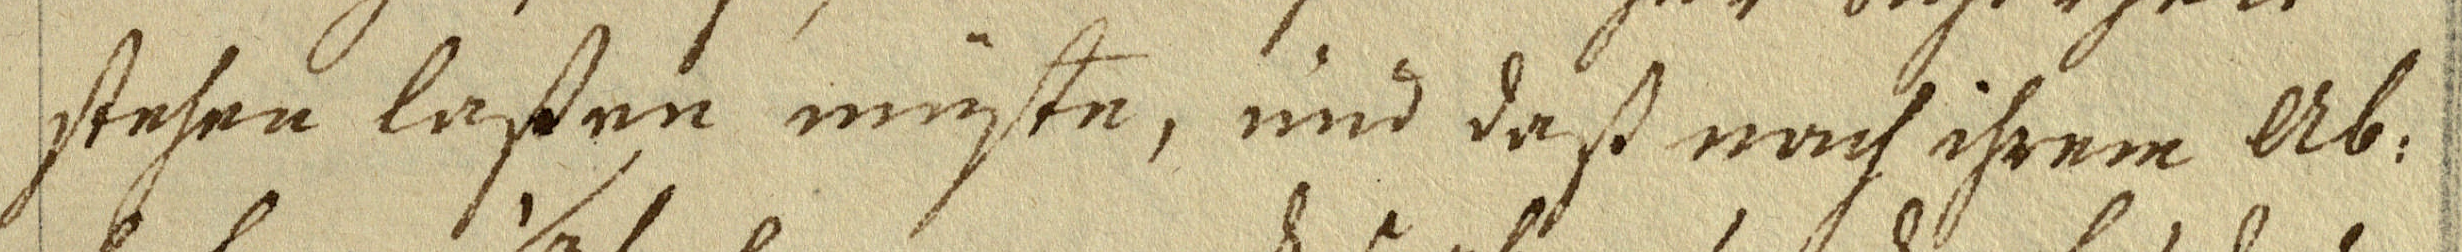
stehen laßen müste, und daß nach ihrem Ab¬
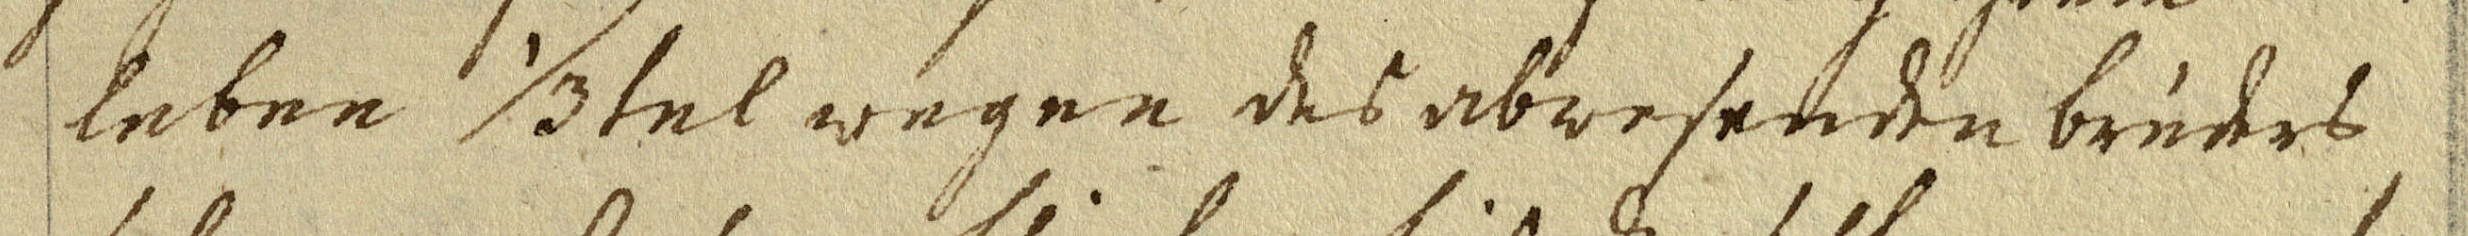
leben 1/3 tel wegen des abwesenden Bruders
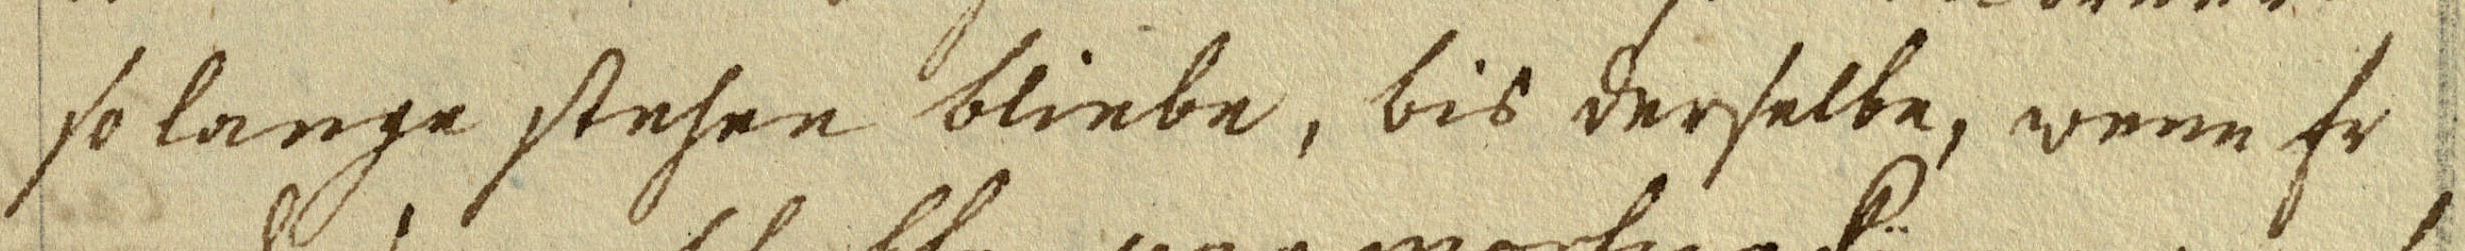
so lange stehen bliebe, bis derselbe, wenn Er
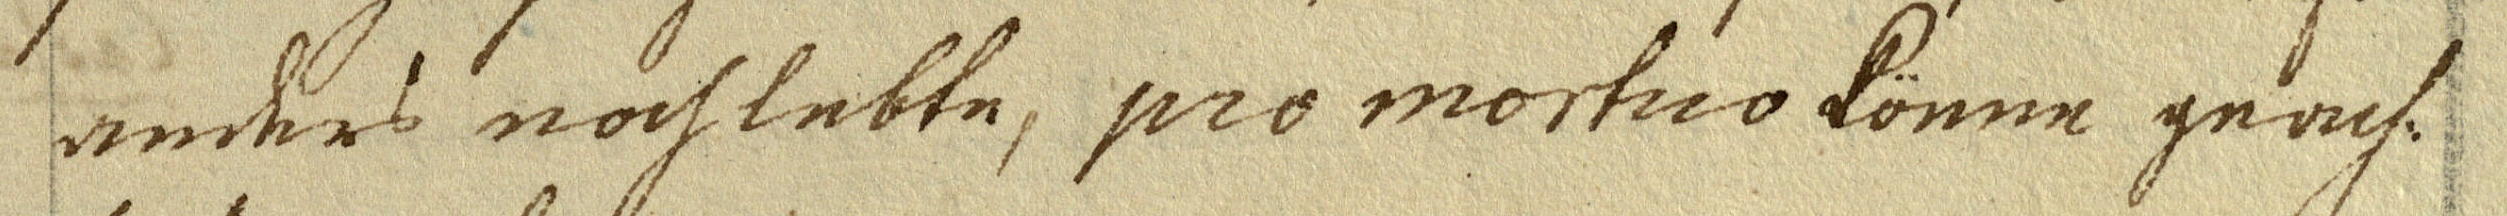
anders noch lebte, pro mortuo könne geach¬
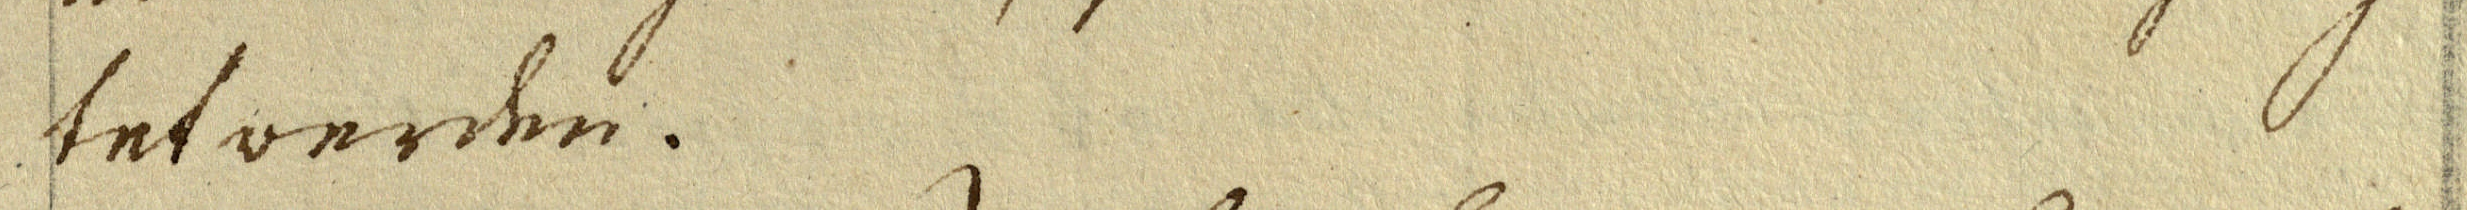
tet werden.
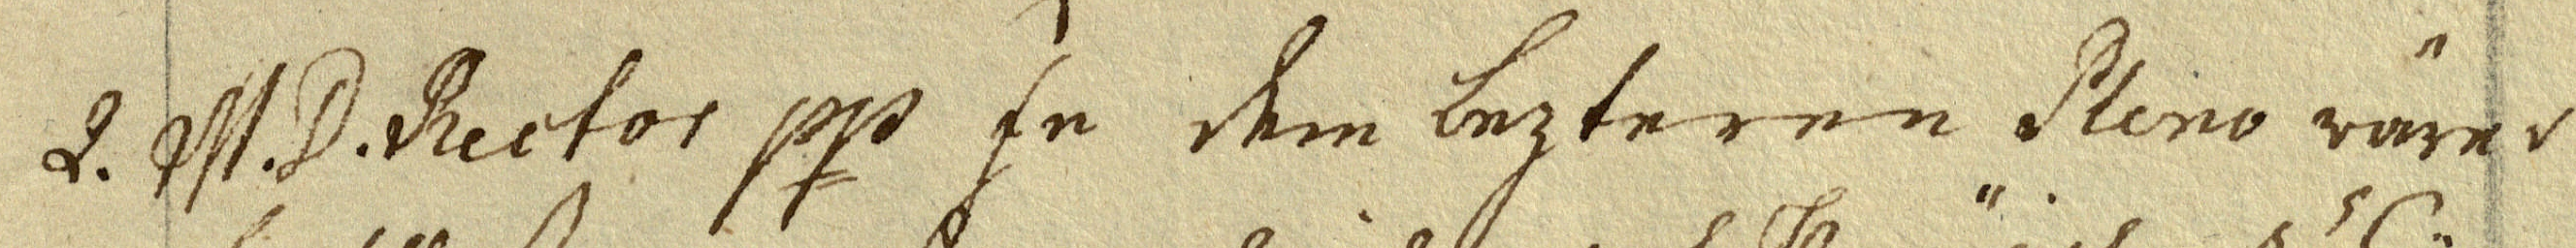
2. M. D. Rector pp In dem lezteren Pleno wäre
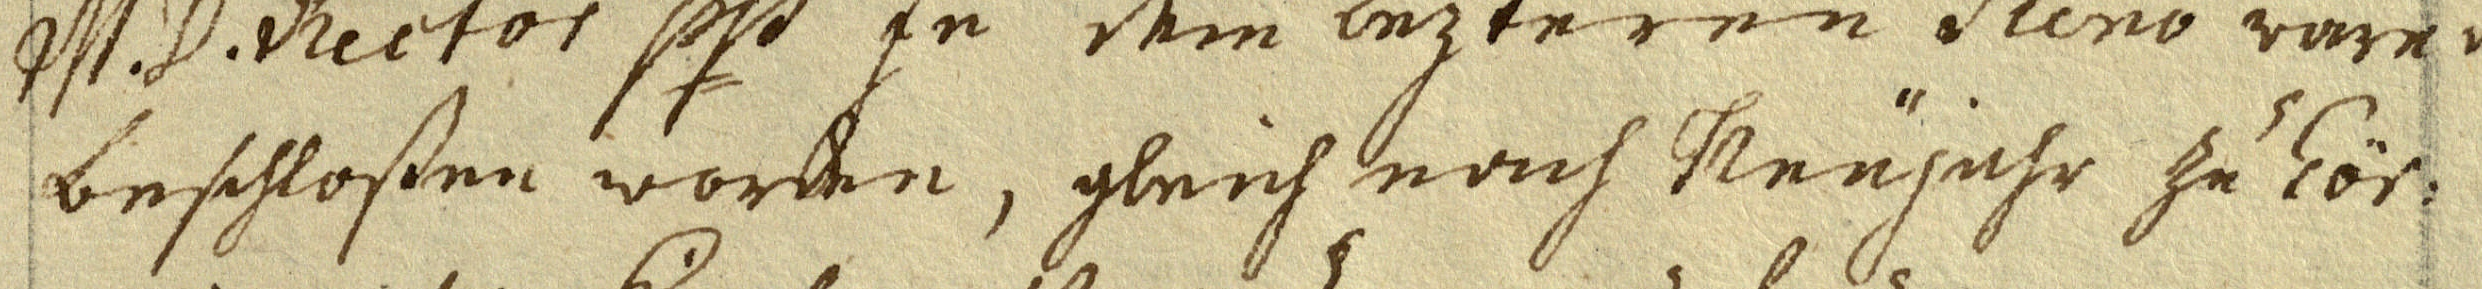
beschloßen worden, gleich nach Neujahr zu Gör¬
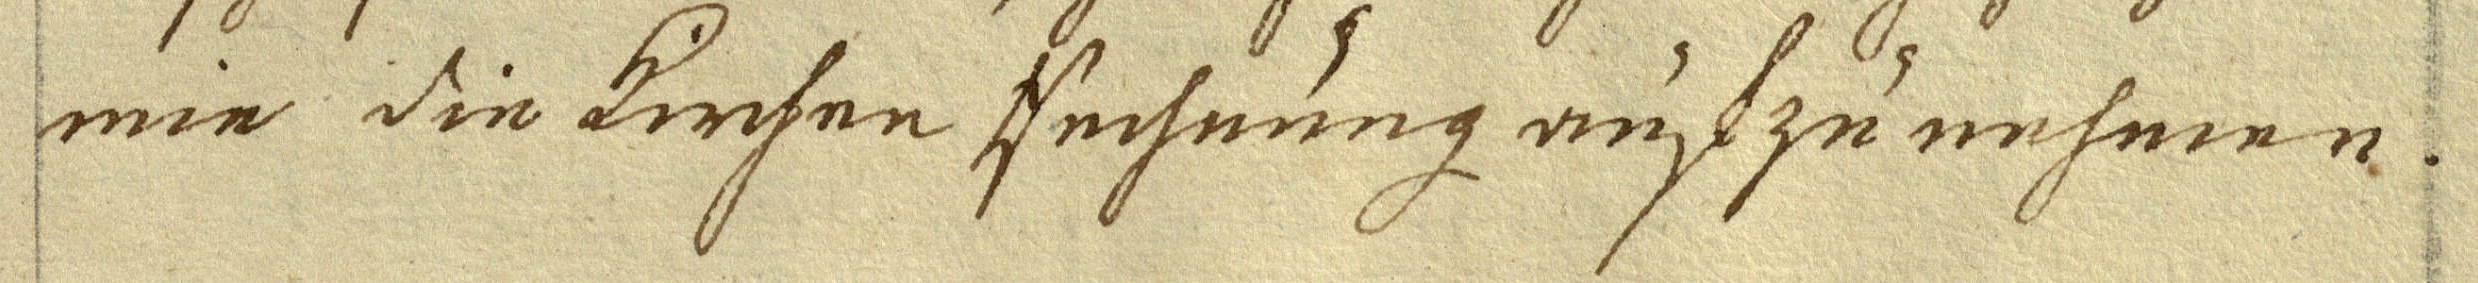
min die Kirchen Rechnung aufzunehmen.
